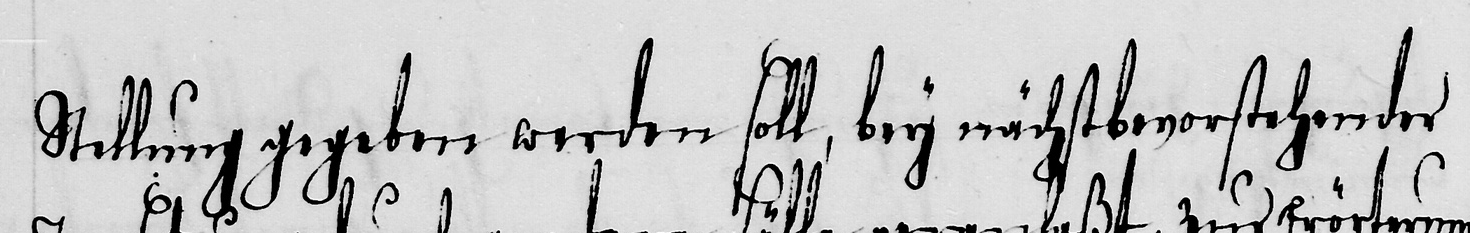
Stellung gegeben werden soll, bey nächstbevorstehender
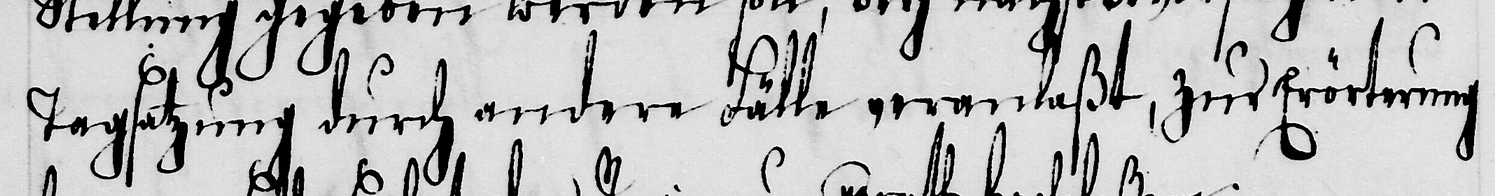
Tagsatzung durch andere Fälle veranlaßt, zur Erörterung
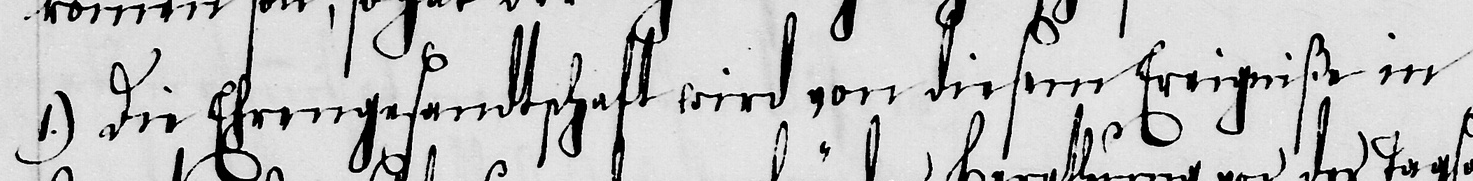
1.) Die Ehrengesandtschaft wird von diesem Ereigniße in
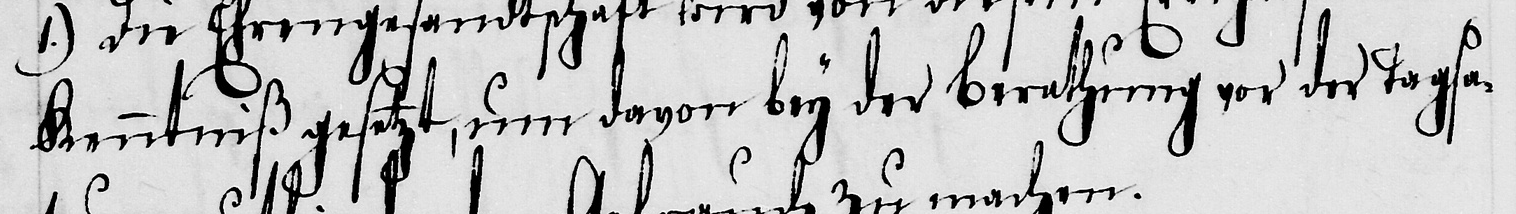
Kenntniß gesetzt, um davon bey der Berathung vor der Tagsa¬
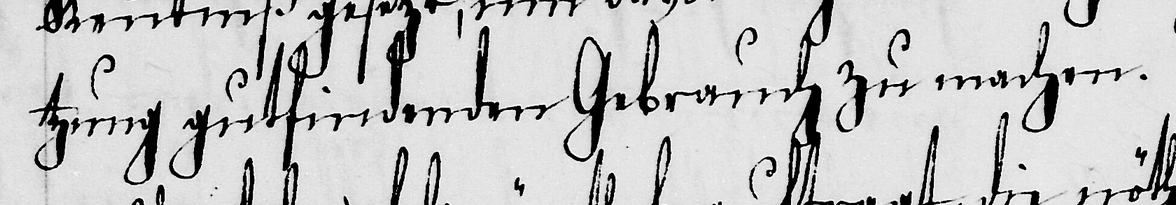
tzung gutfindenden Gebrauch zu machen.
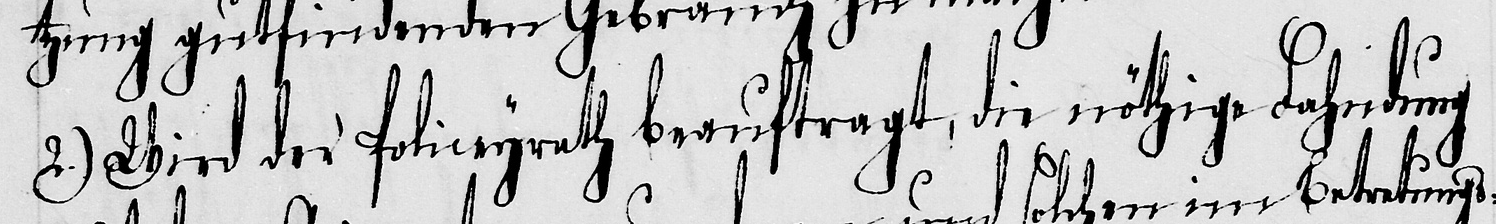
2.) Wird der Policeyrath beauftragt, die nöthige Fahndung
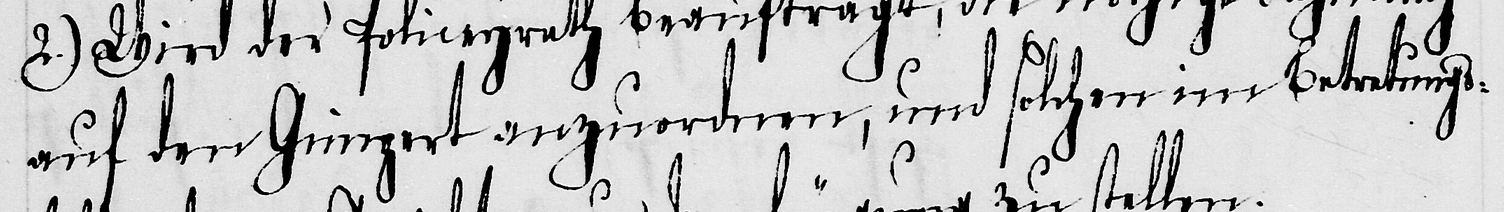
auf den Gingert anzuordnen, und solchen im Betretungs¬
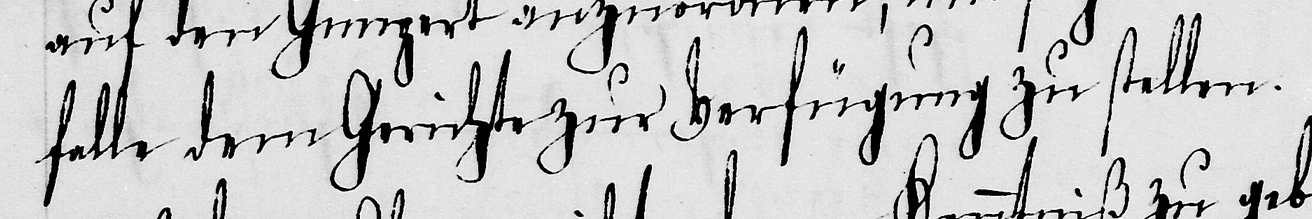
falle dem Gerichte zur Verfügung zu stellen.
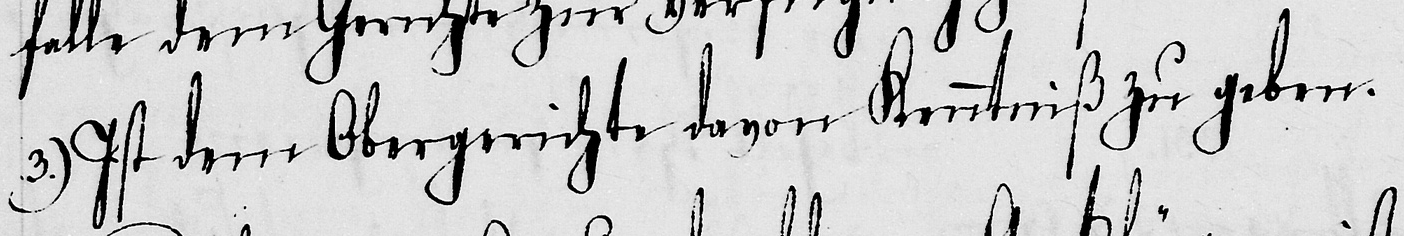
3.) Ist dem Obergerichte davon Kenntniß zu geben.
